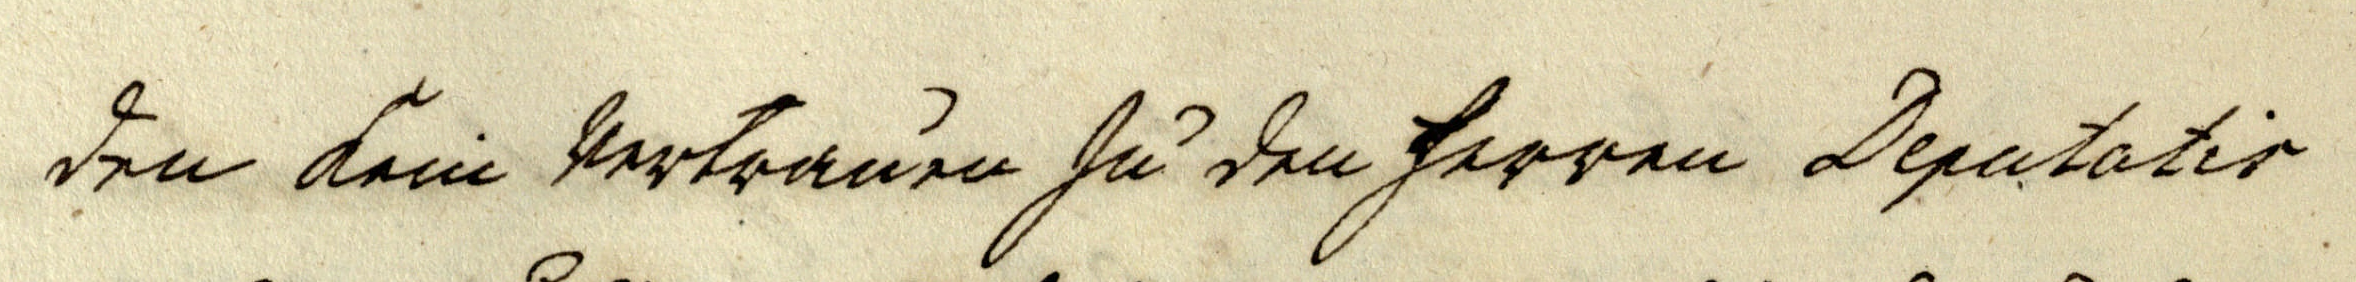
den kein Vertrauen zu den Herren Deputatis
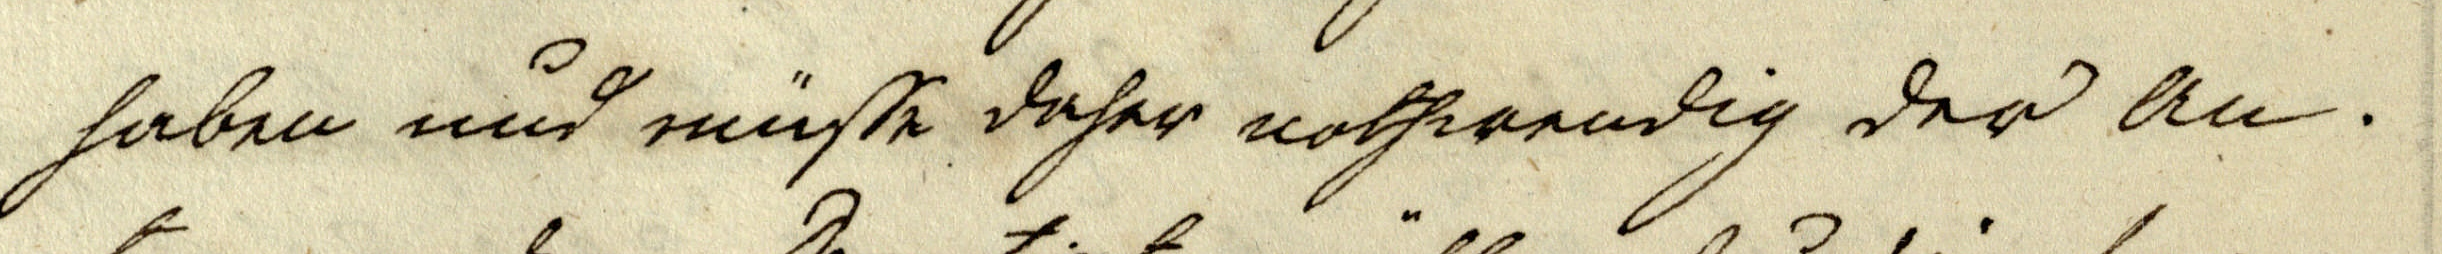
haben und müsse daher nothwendig der An¬
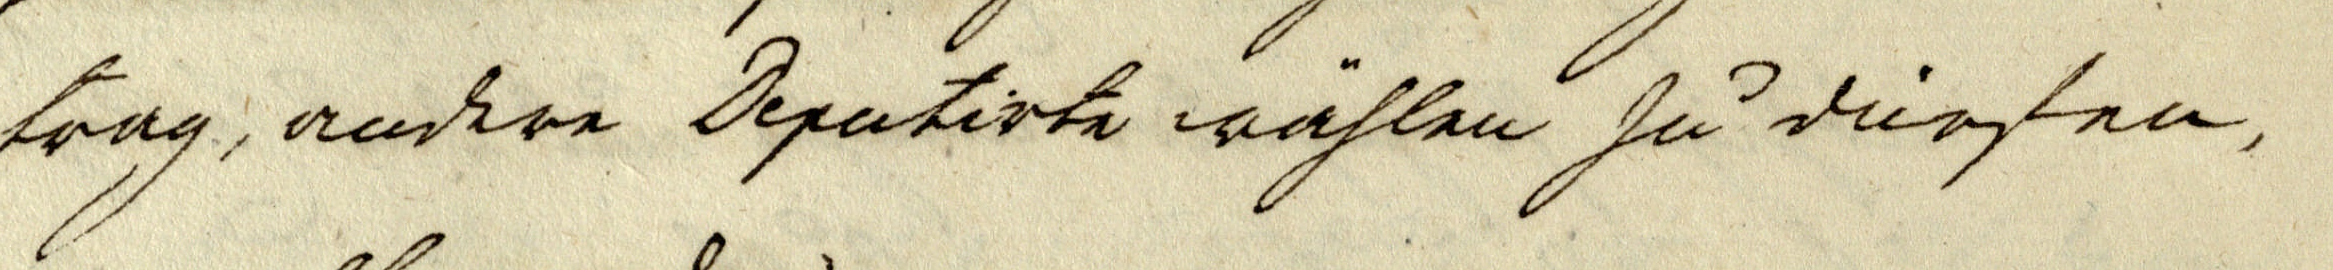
trag, andere Deputirte wählen zu dürfen,
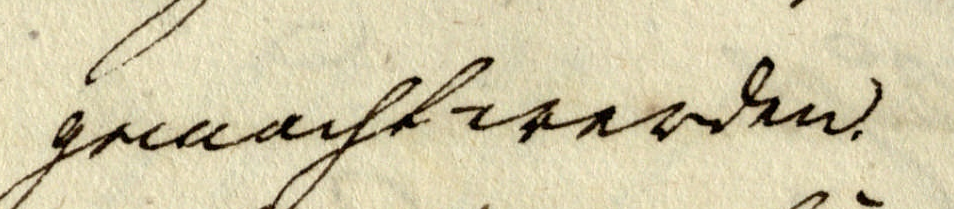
gemacht werden.
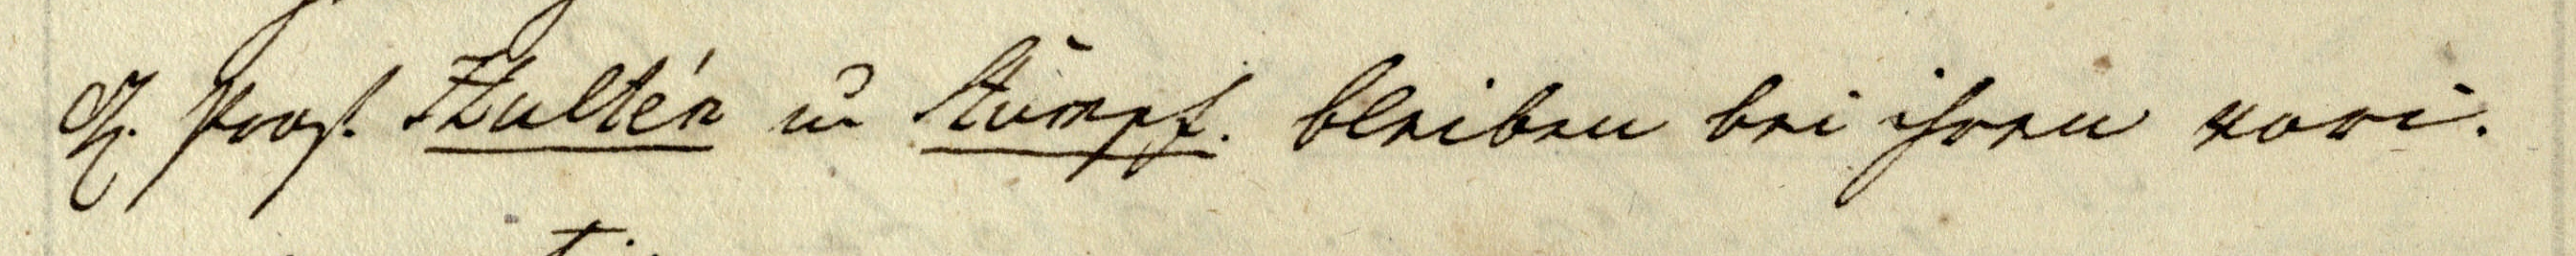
dh. Prof. Hultén u. Stumpf. bleiben bei ihren vori¬
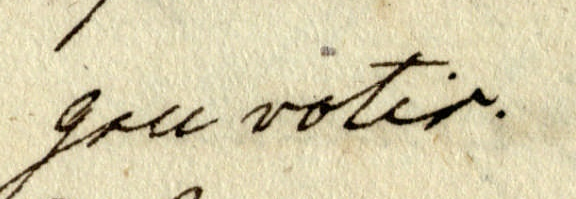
gen votis.
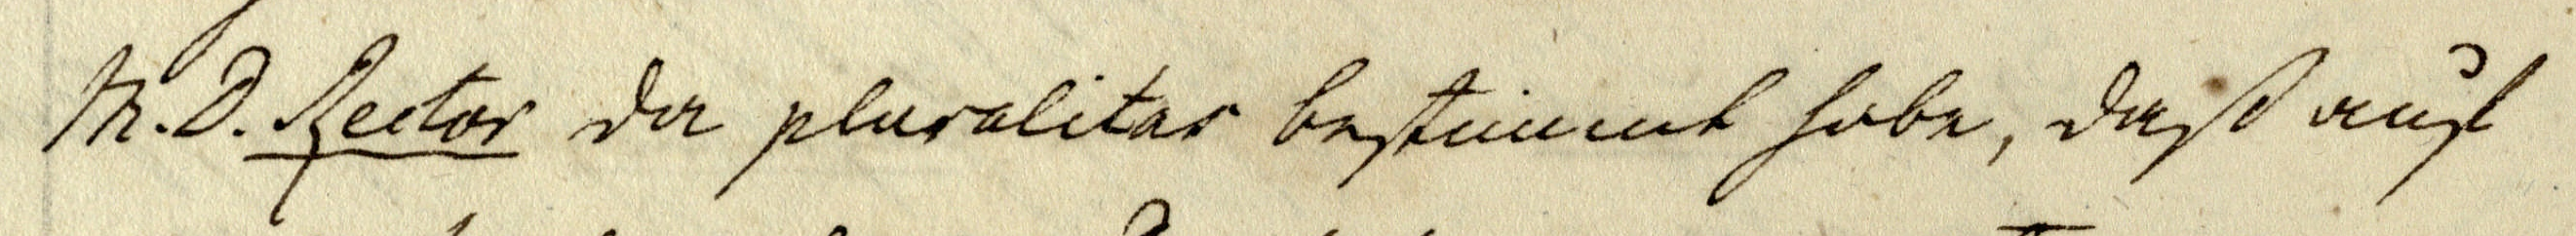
M. D. Rector da pluralitas bestimmt habe, daß auf
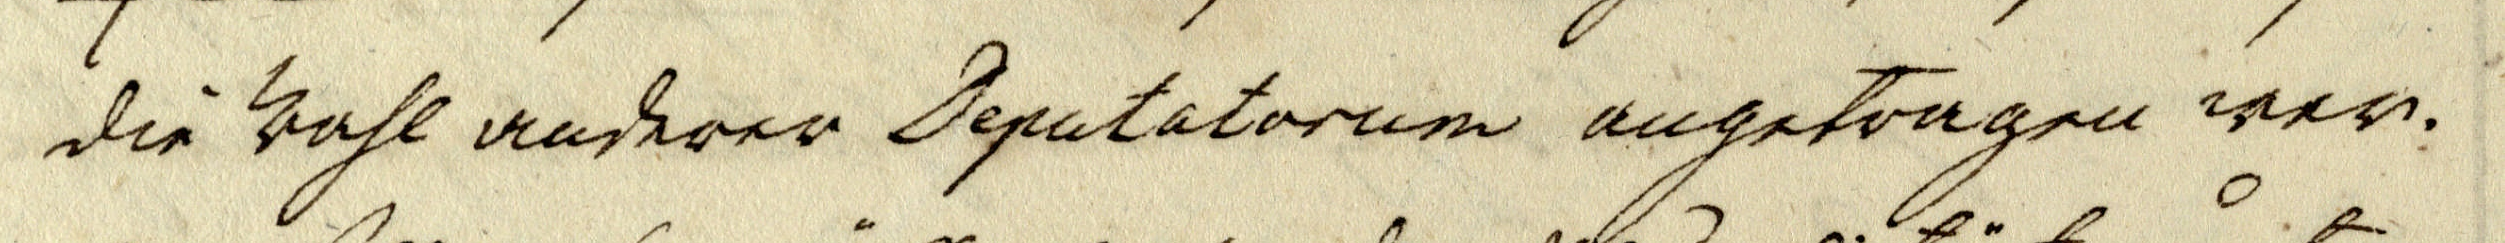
die Wahl anderer Deputatorum angetragen wer¬
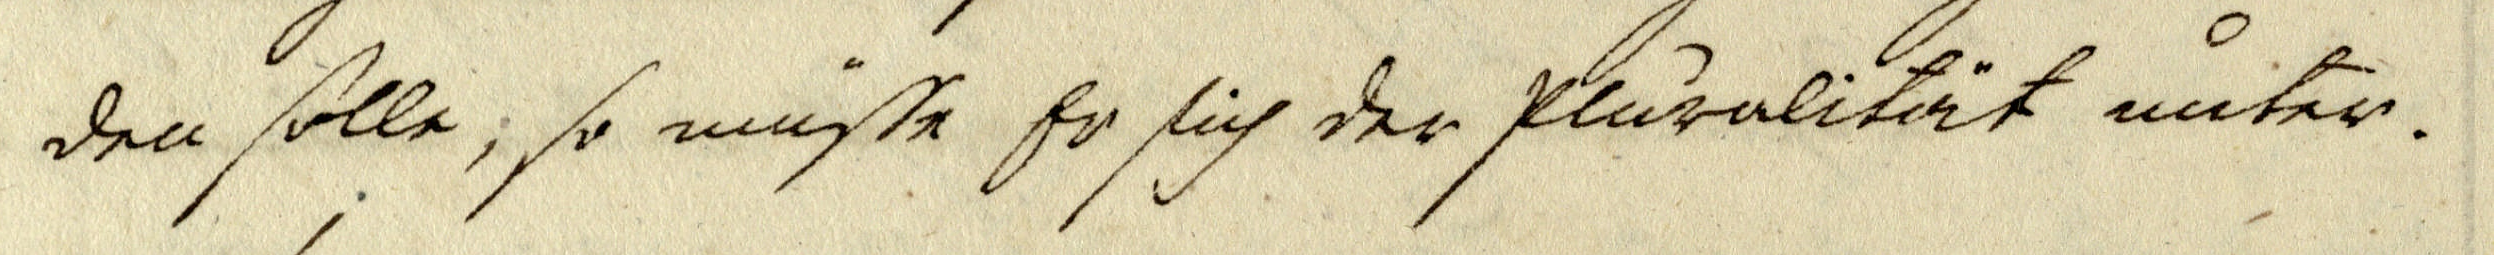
den solle, so müsse Er sich der Pluralität unter¬
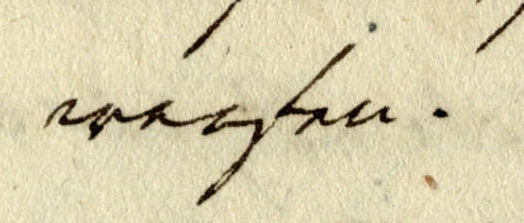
werfen.
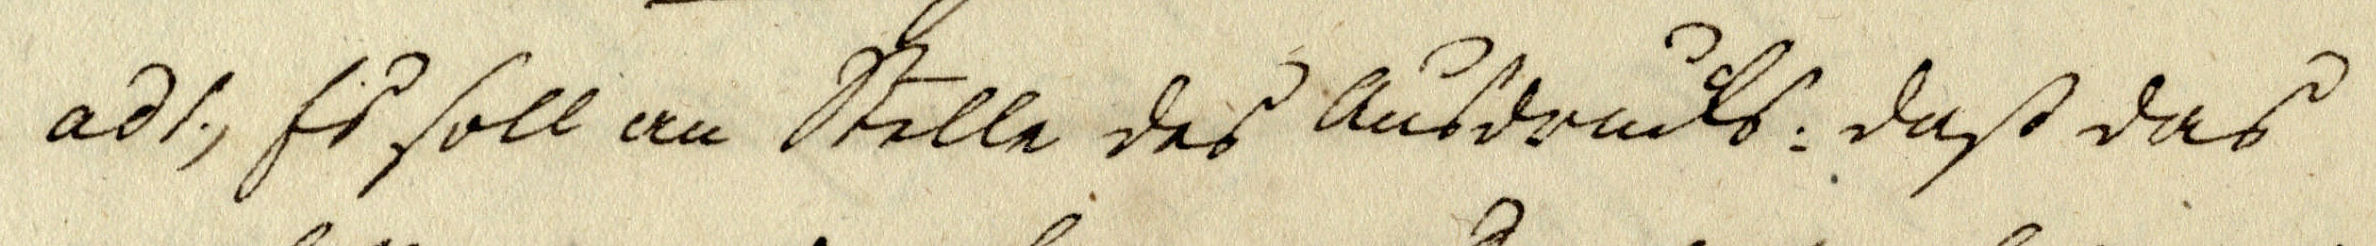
ad 1., Es soll an Stelle des Ausdrucks: daß das
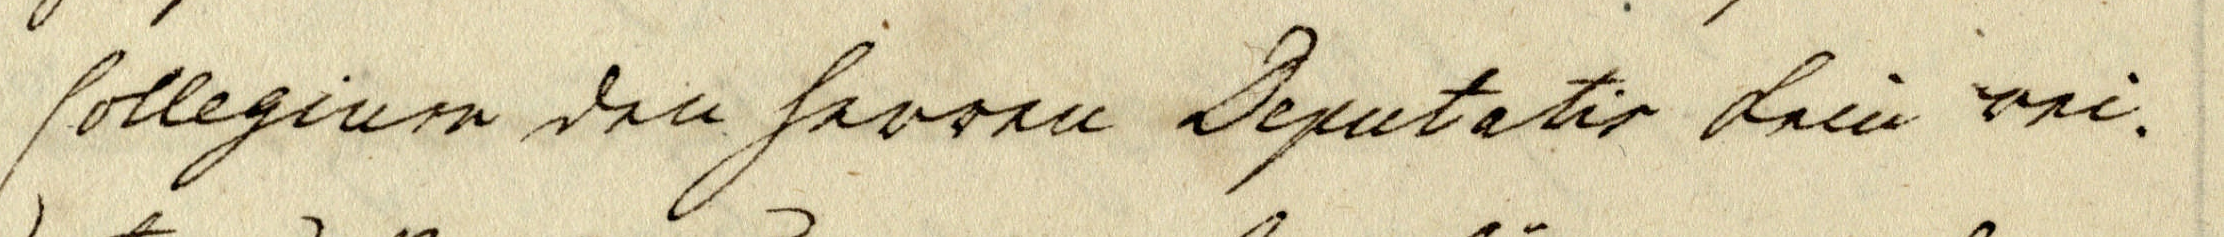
Collegium den Herren Deputatis kein wei¬
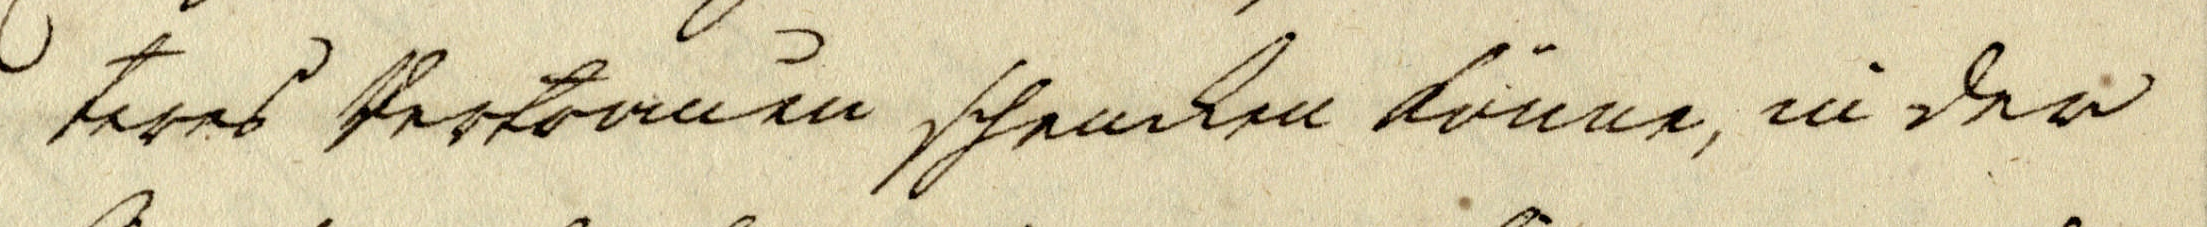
teres Vertrauen schencken könne, in der
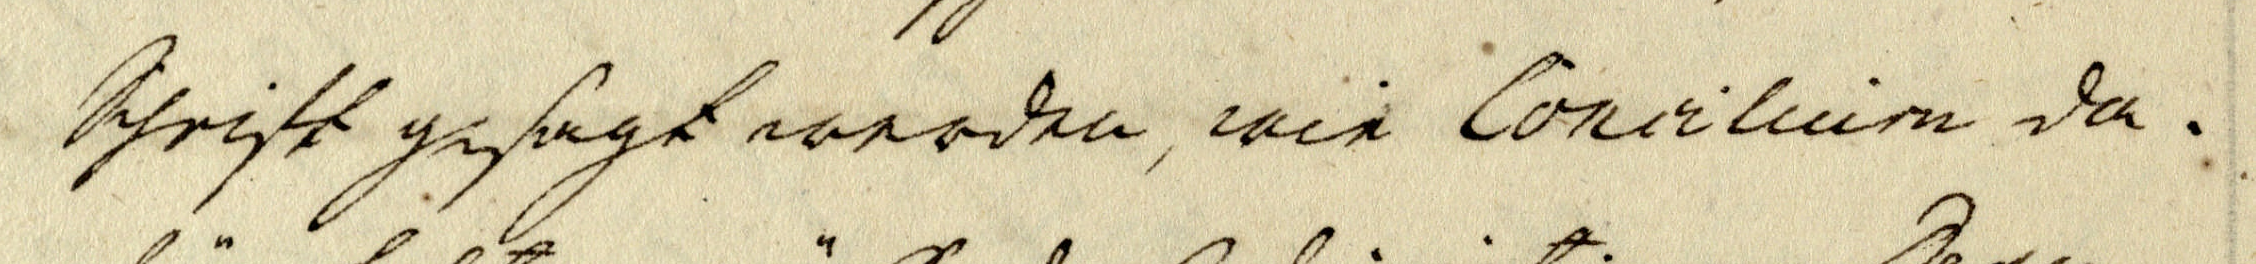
Schrift gesagt werden, wie Concilium da¬
